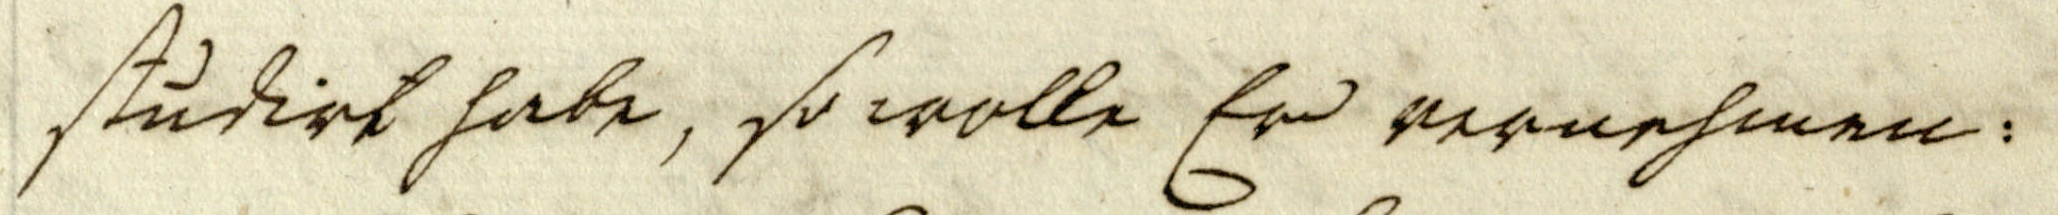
studirt habe, so wolle Er vernehmen:
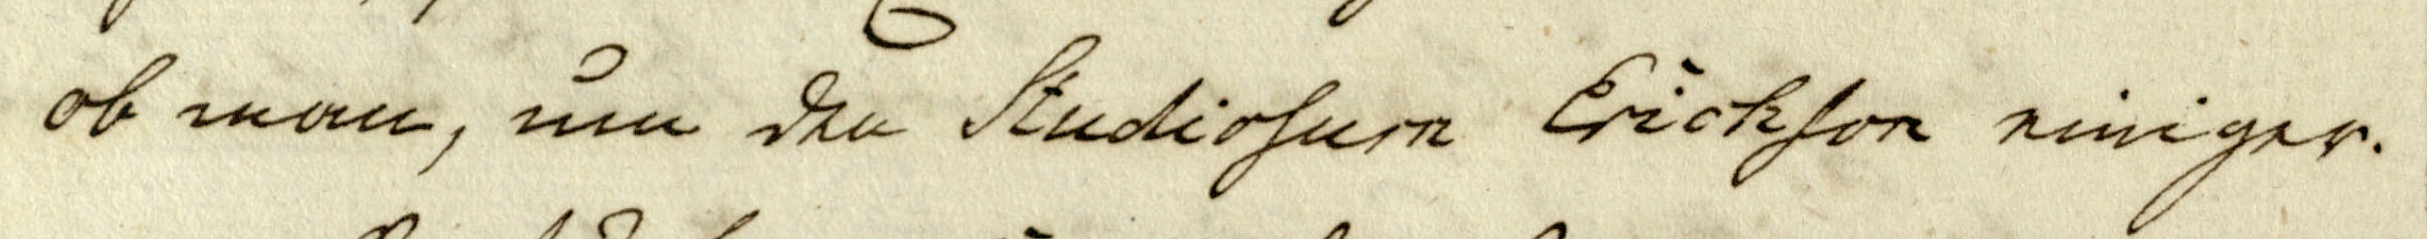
ob man, um den Studiosum Erichson einiger¬
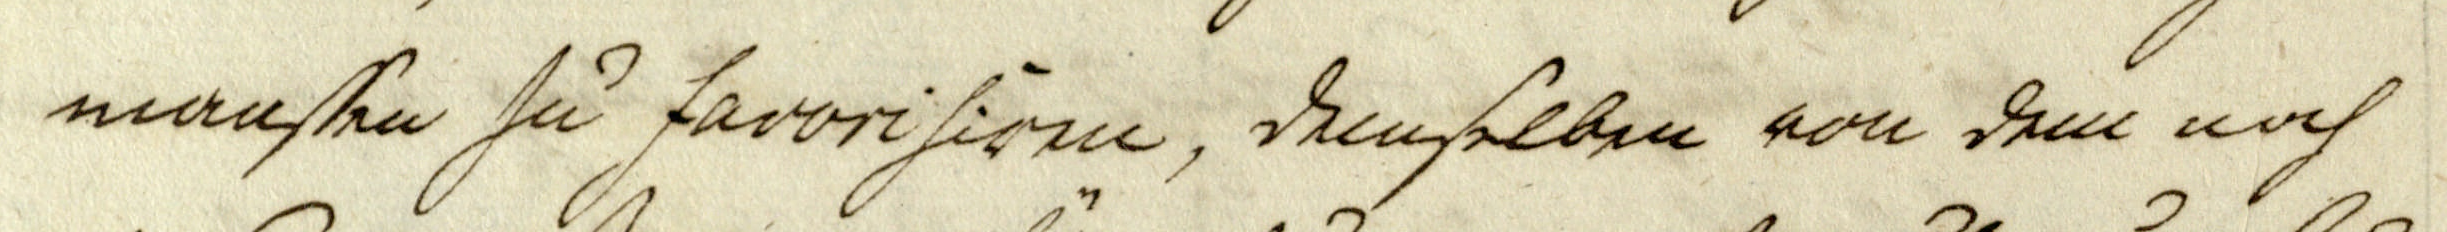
maassen zu favorisiren, demselben von dem noch
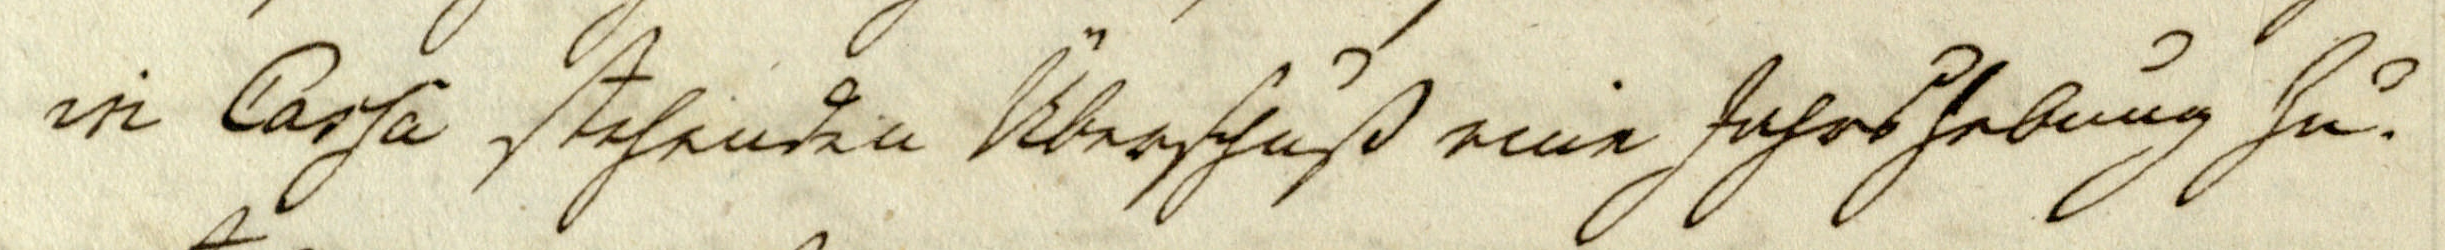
in Cassa stehenden Überschuß eine Jahreshebung zu¬
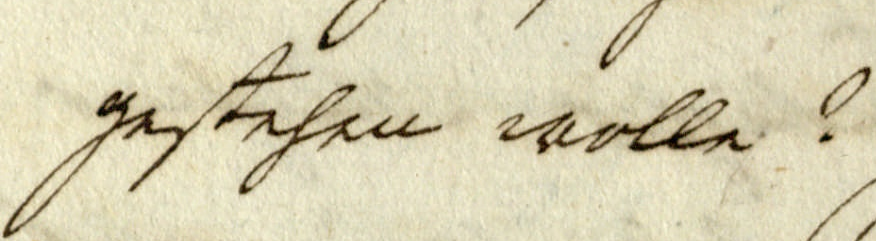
gestehen wolle?
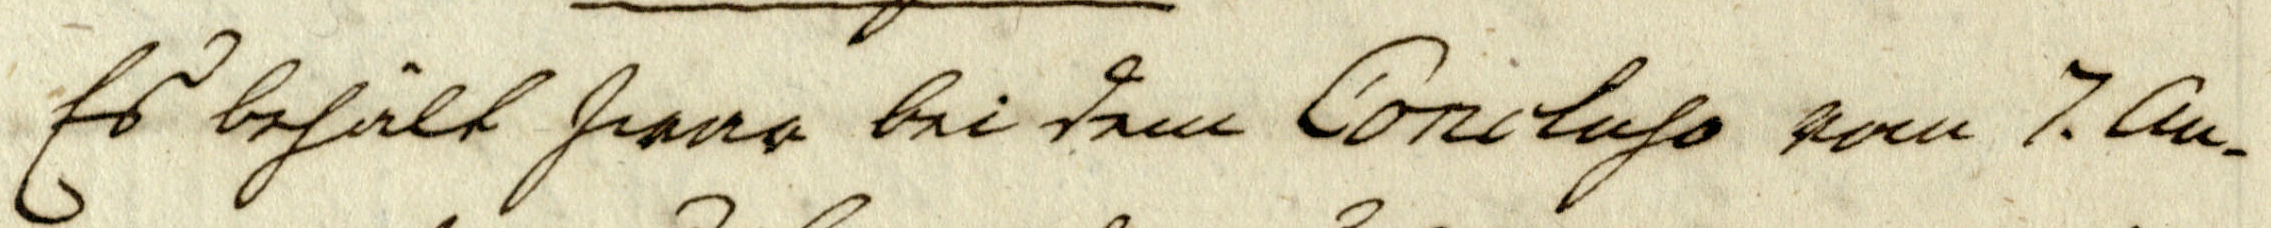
Es behält zwar bei dem Concluso vom 7. Au¬
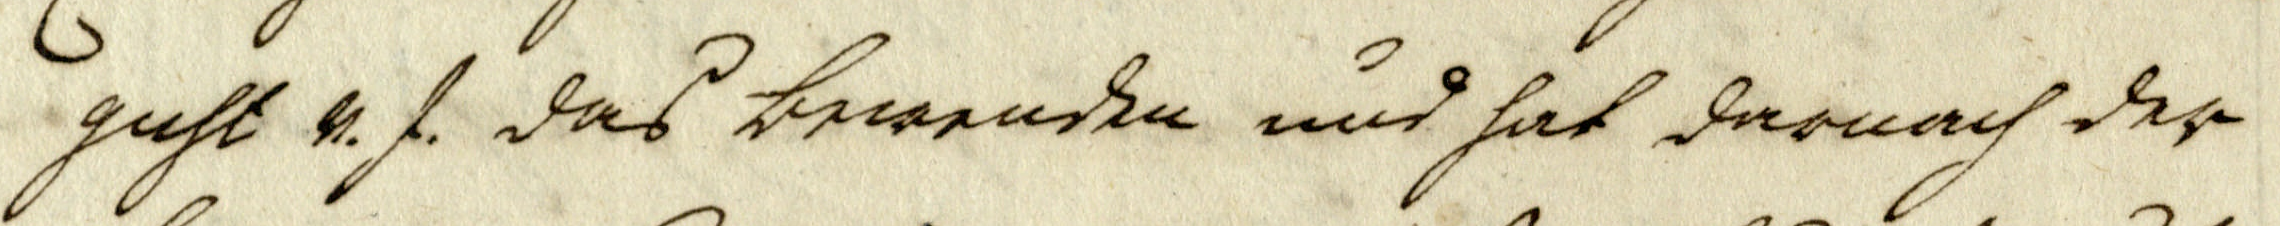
gust v. J. das Bewenden und hat darnach der
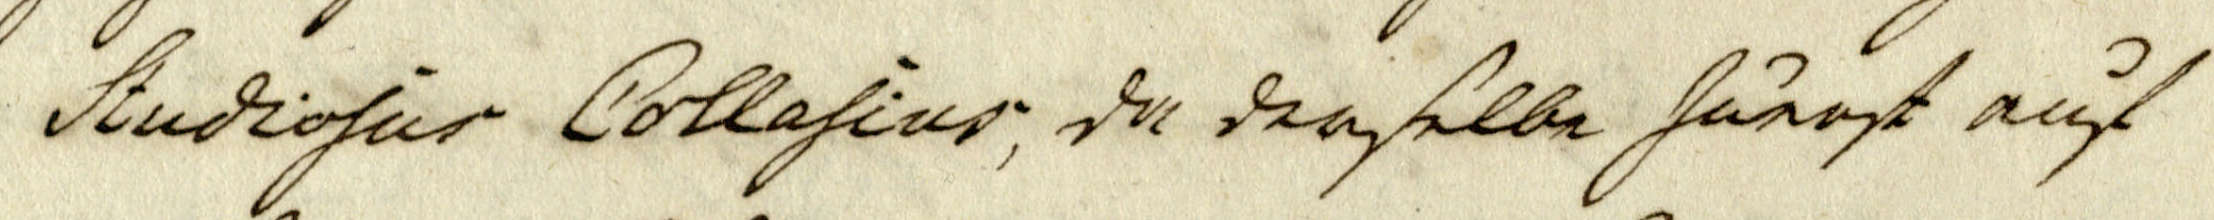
Studiosus Collasius, da derselbe zuerst auf
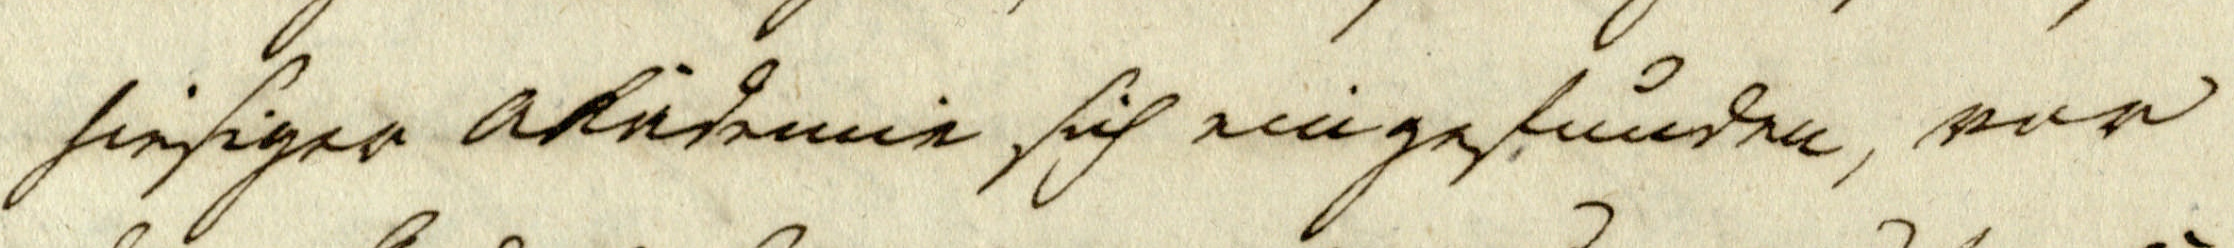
hiesiger Akademie sich eingefunden, vor¬
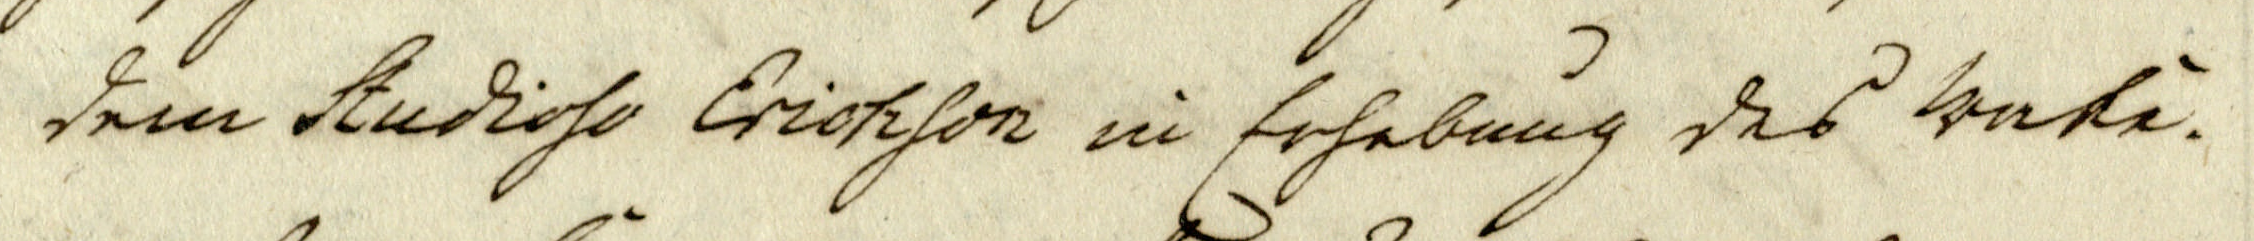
dem Studioso Erichson in Erhebung des Wake¬
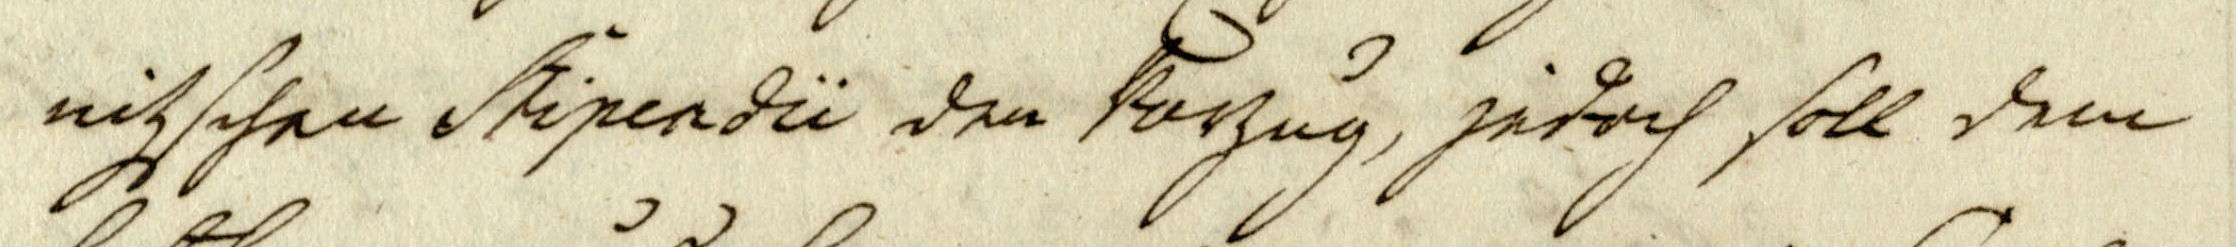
nizschen Stipendii den Vorzug, jedoch soll dem
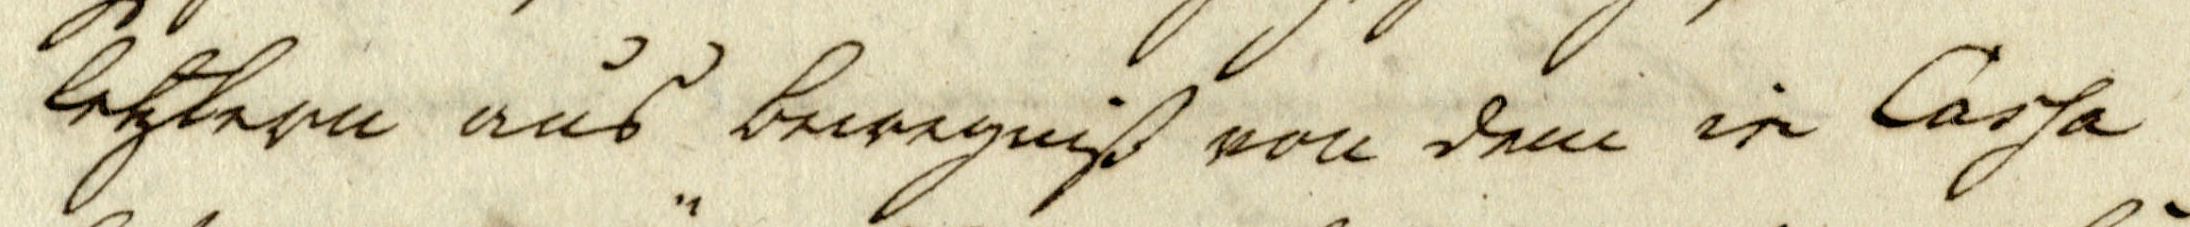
letzteren aus Bewegniß von dem in Cassa
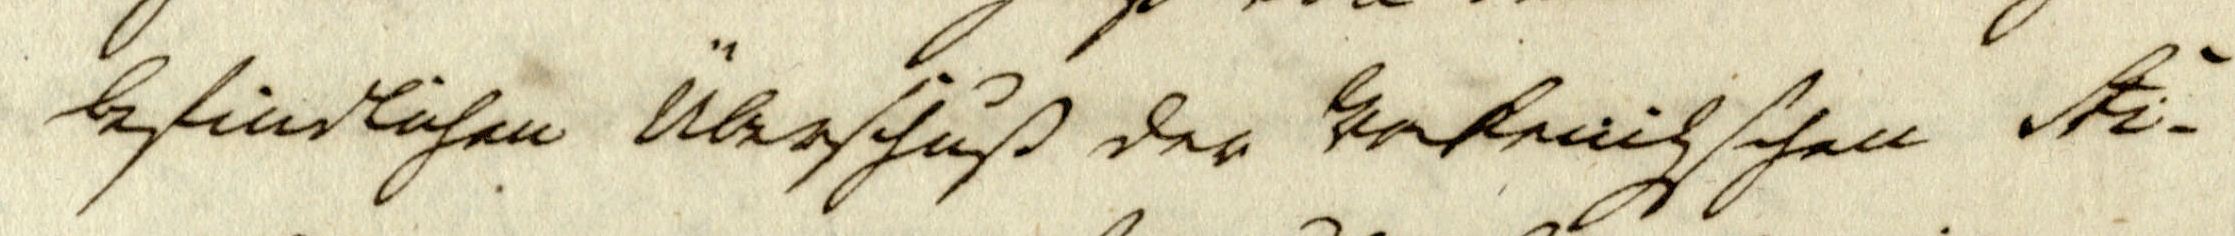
befindlichen Überschuß der Wakenizschen Sti¬
